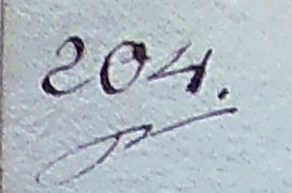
204.
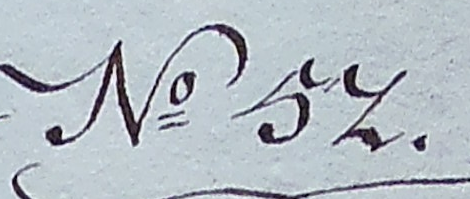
No͇ 52.
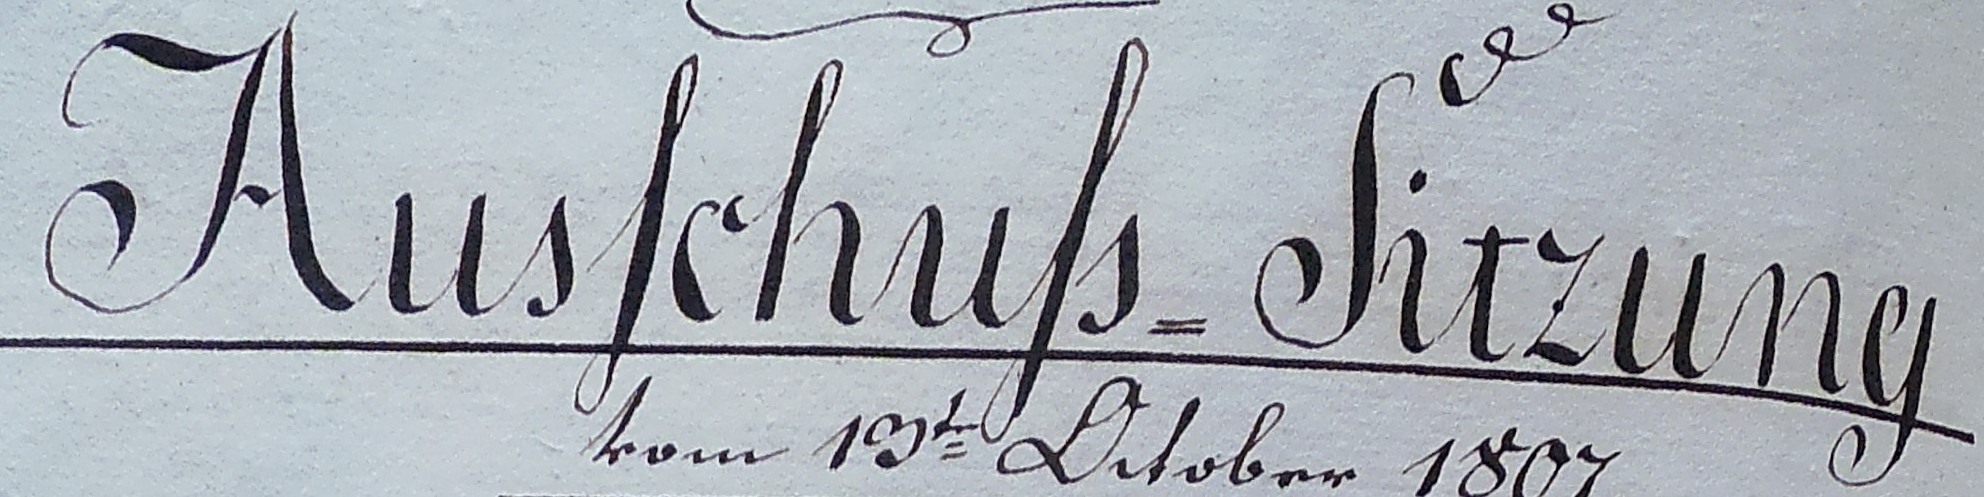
Ausschuss‗Sitzung
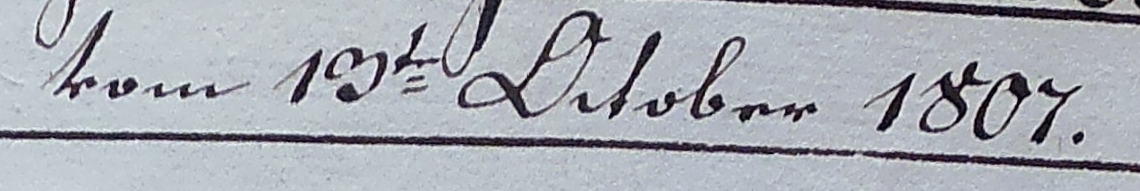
vom 13te͇ October 1807.
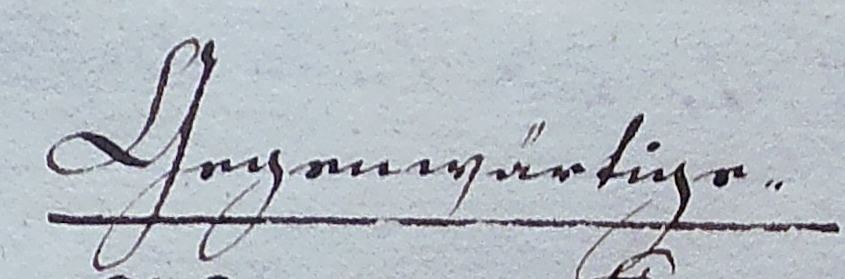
Gegenwärtige.
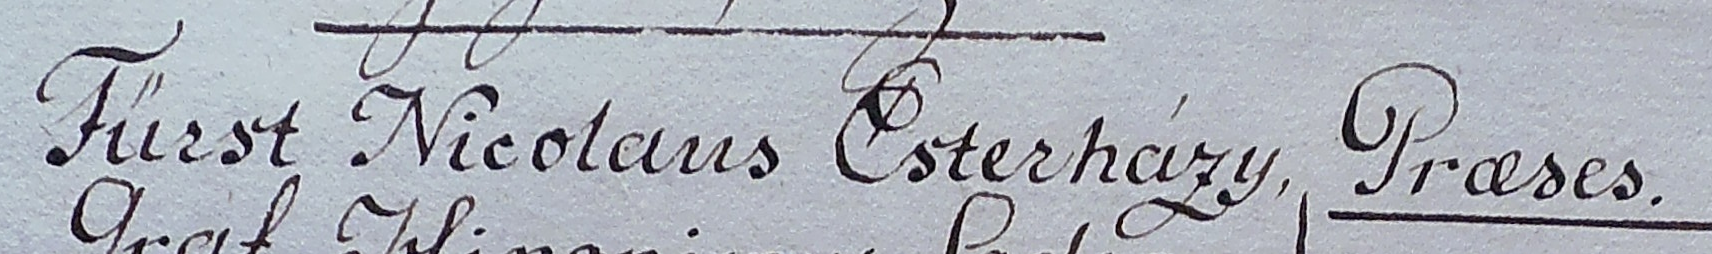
Fürst Nicolaus Esterházy, Præses.
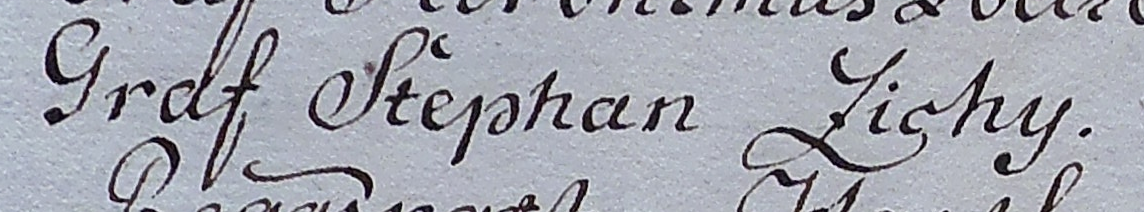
Graf Stephan Zichy.
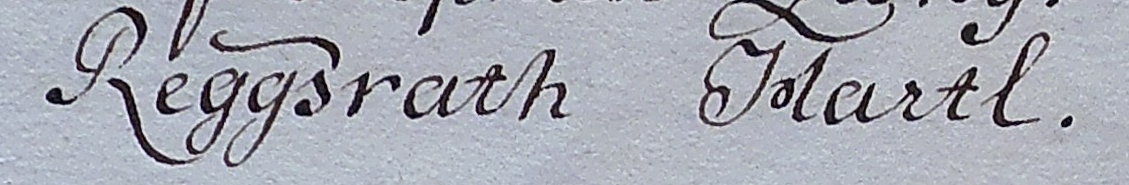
Reg͞gsrath Hartl.
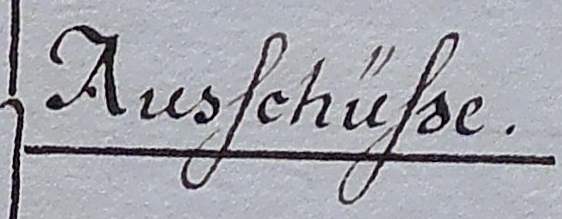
Ausschüsse.
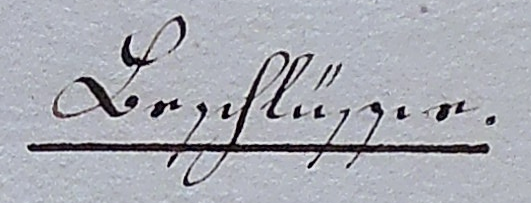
Beschlüsse.
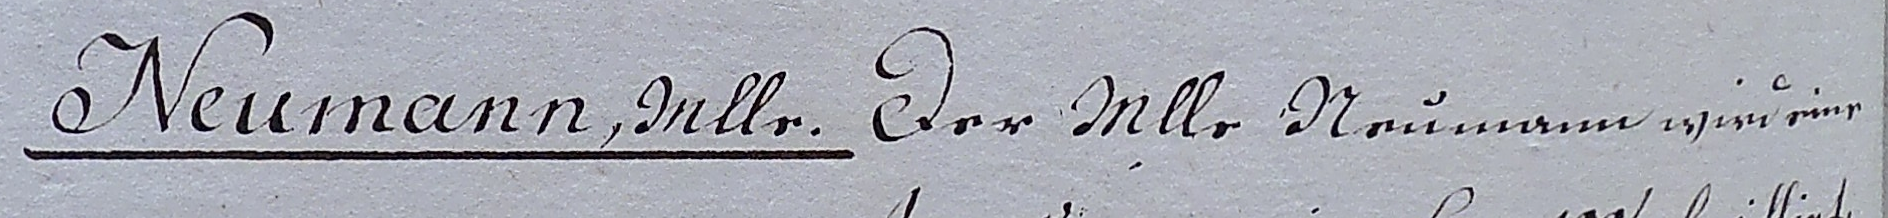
Neumann, Mlle. Der Mlle Neumann wird eine
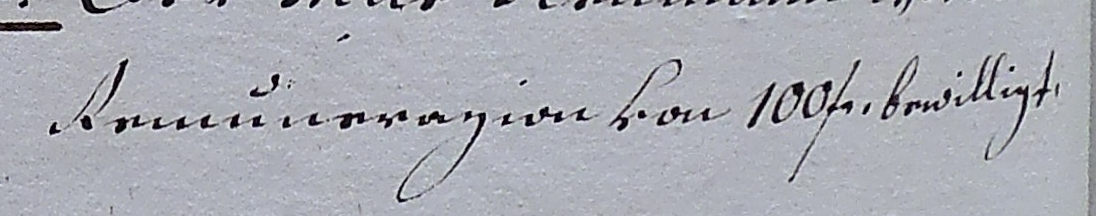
Remunerazion von 100fr. bewilligt.
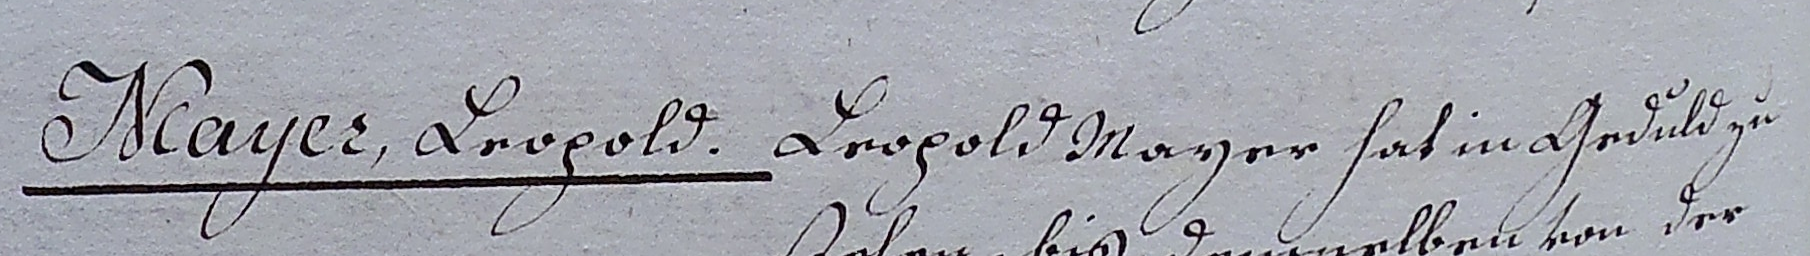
Mayer, Leopold. Leopold Mayer hat in Geduld zu
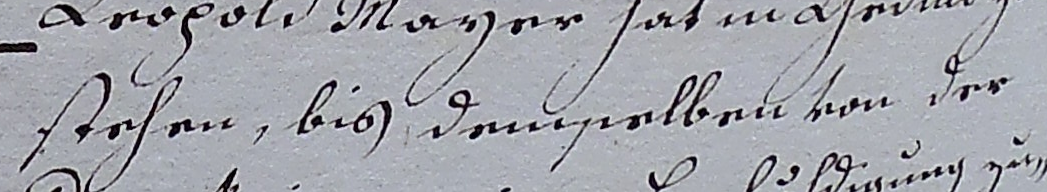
stehen, bis demselben von der
